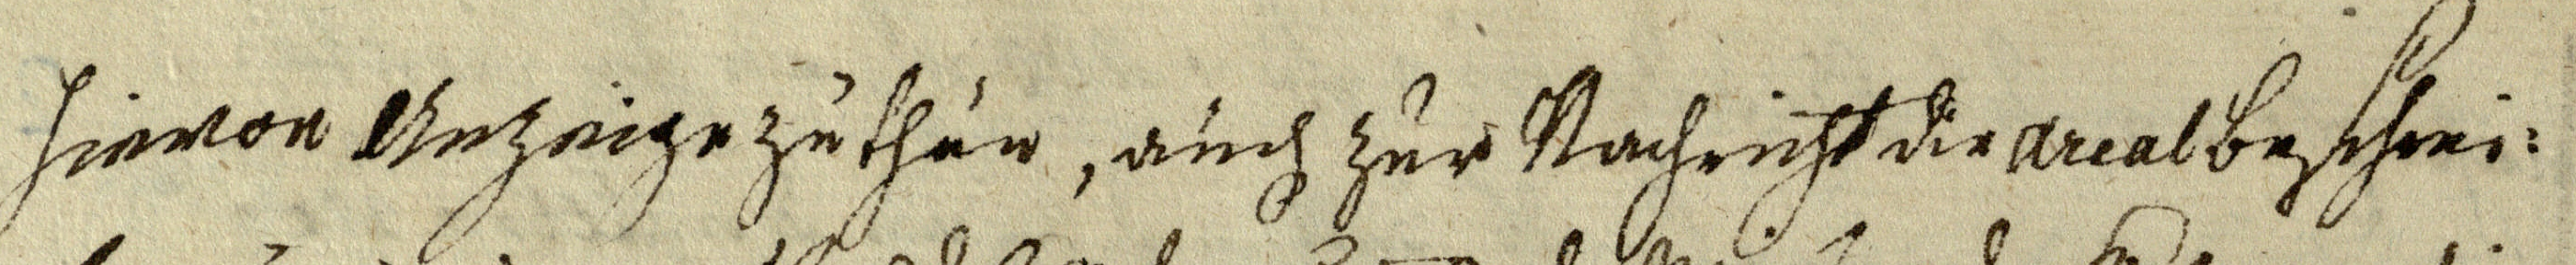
hievon Anzeige zu thun, auch zur nachricht die Arealbeschrei¬
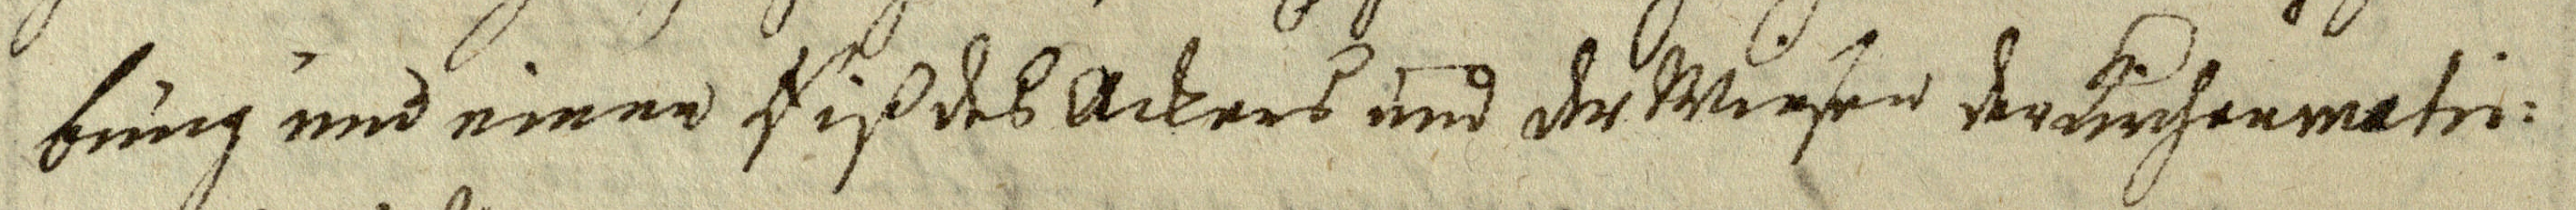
bung und einen Riß des Ackers und der Wiesen der Kirchenmatri¬
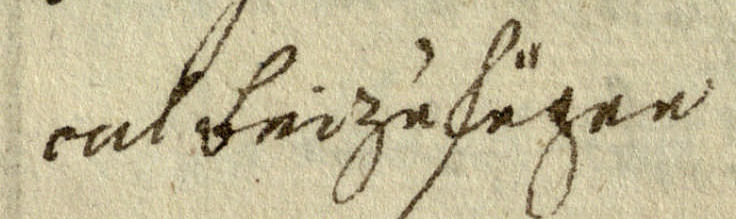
cul beizufügen.
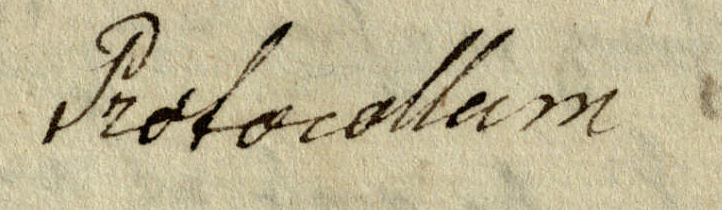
Protocollum
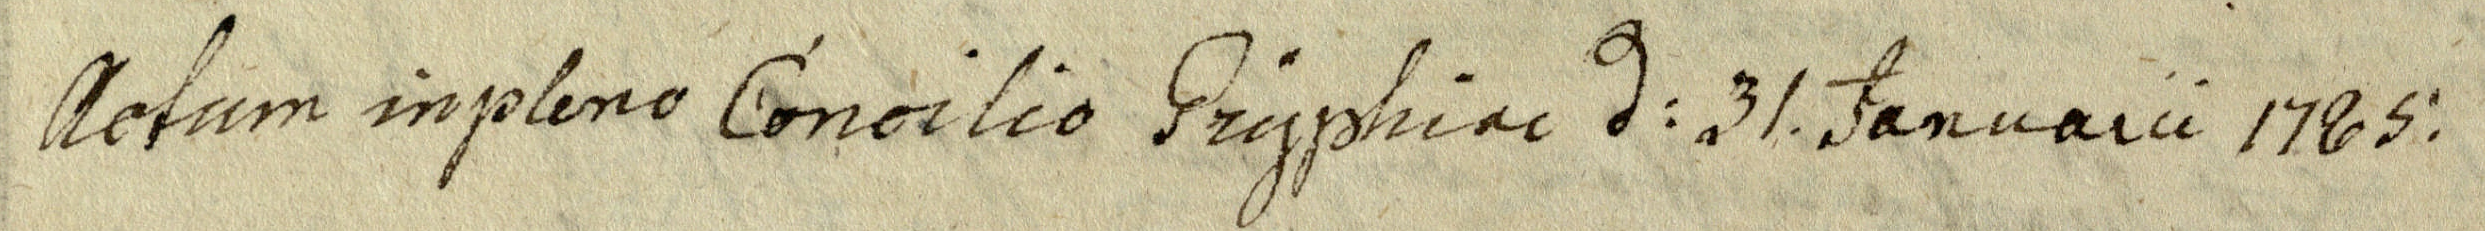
Actum in pleno Concilio Grÿphiae d. 31. Januarii 1785.
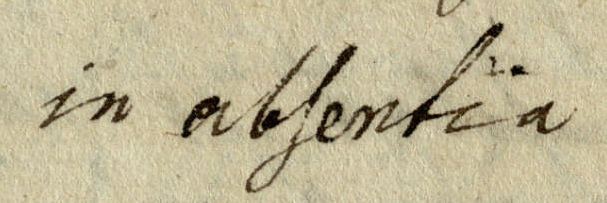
in absentia
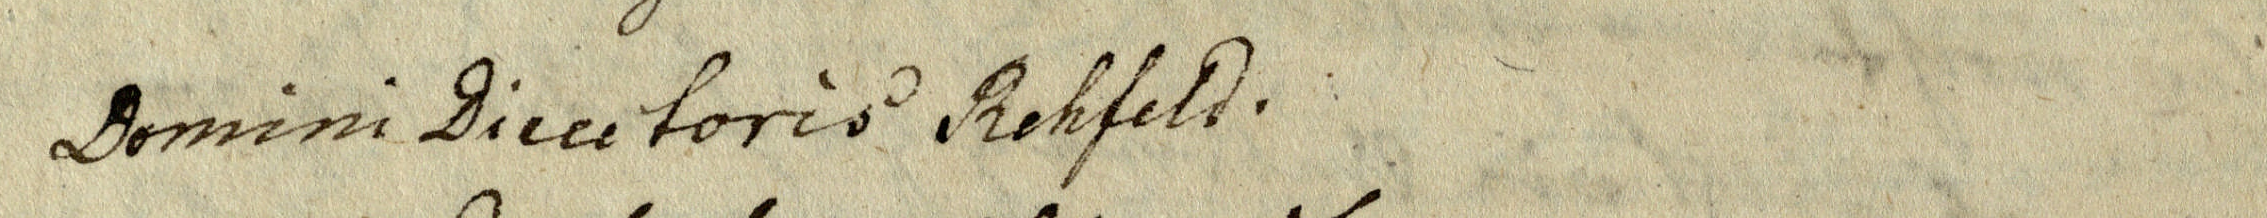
Domini Directoris Rehfeld.
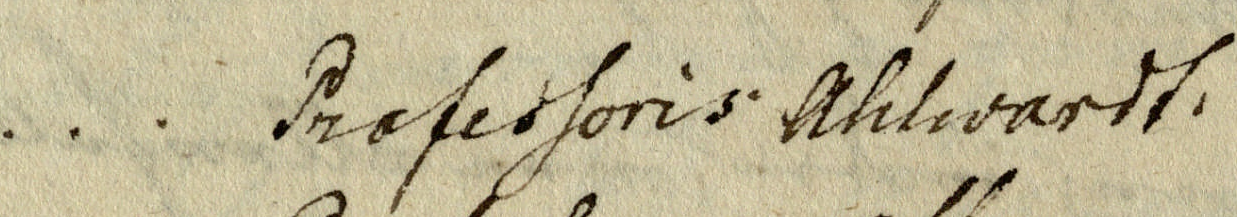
Professoris Ahlwardt.
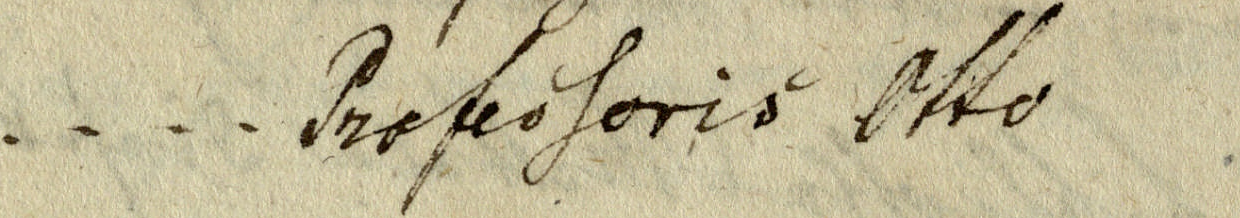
Professoris Otto
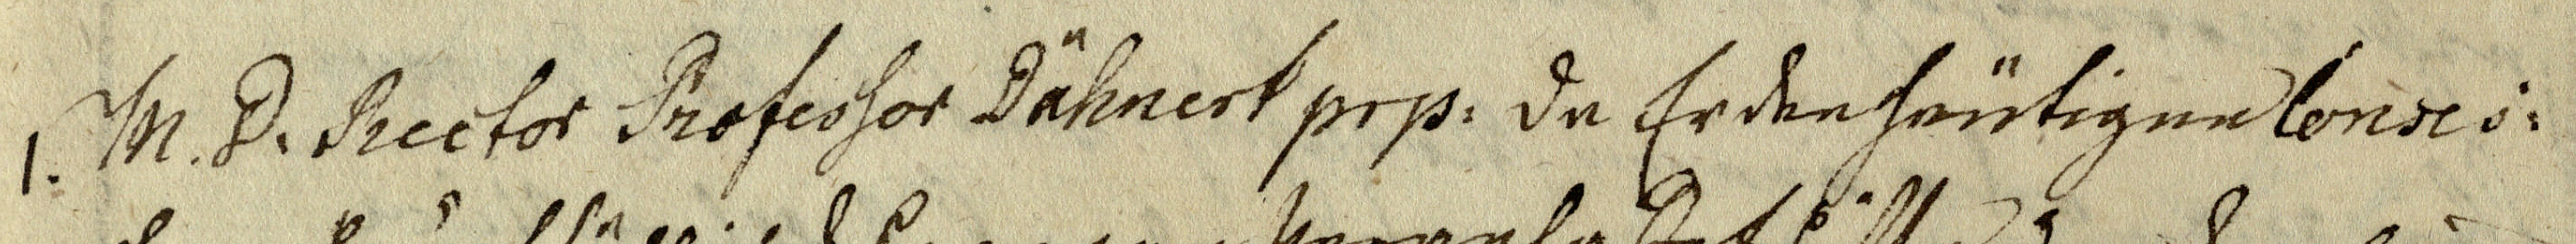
1. M. D. Rector Professor Dähnert prp. Da Er den heutigen Conses¬
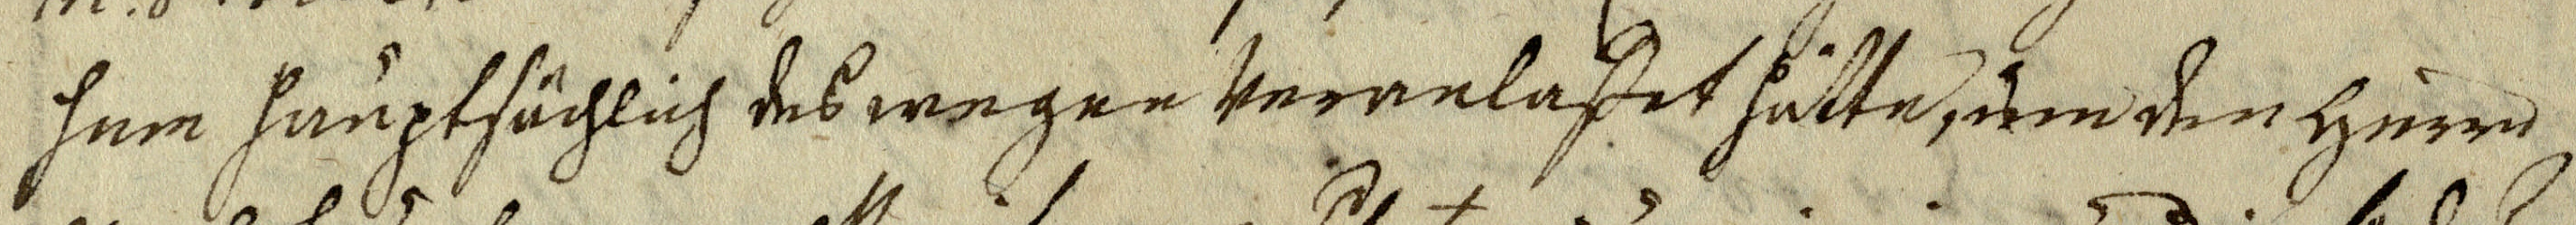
sum hauptsächlich deswegen veranlaßet hätte, um den Herrn
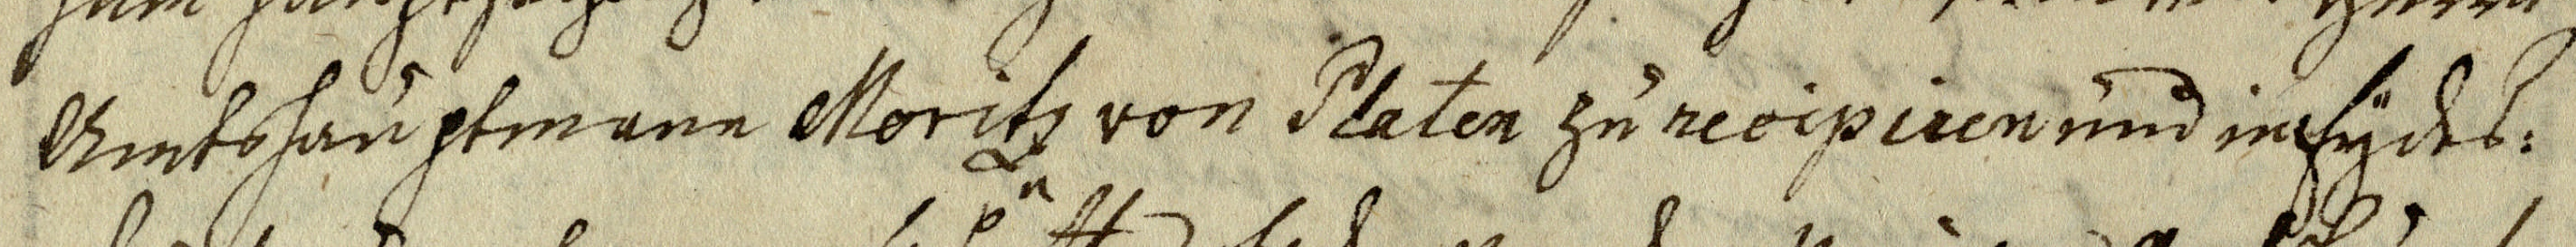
Amtshauptmann Moritz von Platen zu recipiren und in Eÿdes¬
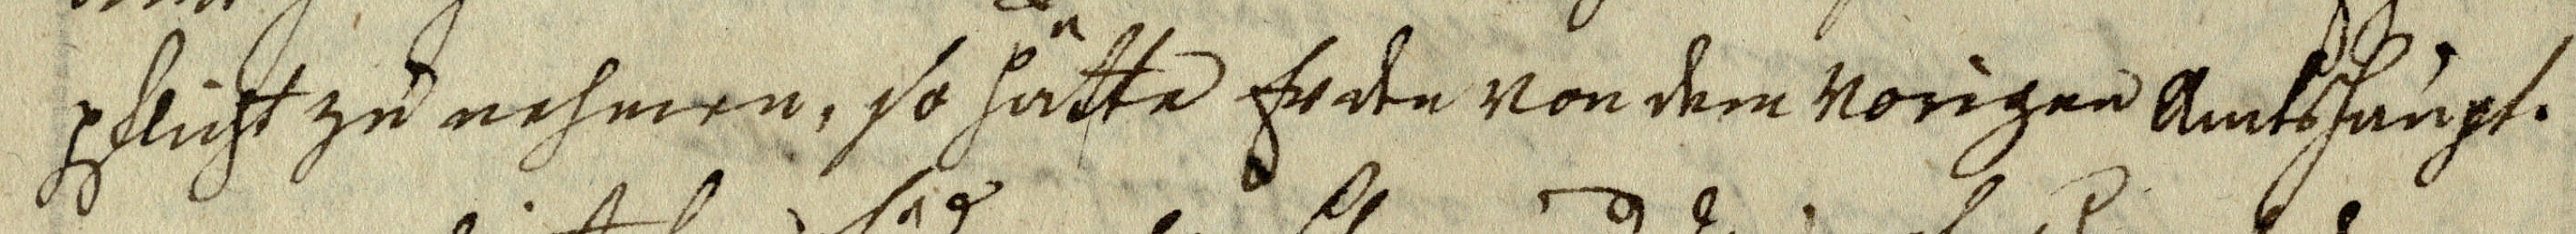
pflicht zu nehmen, so hätte Er den von dem vorigen Amtshaupt¬
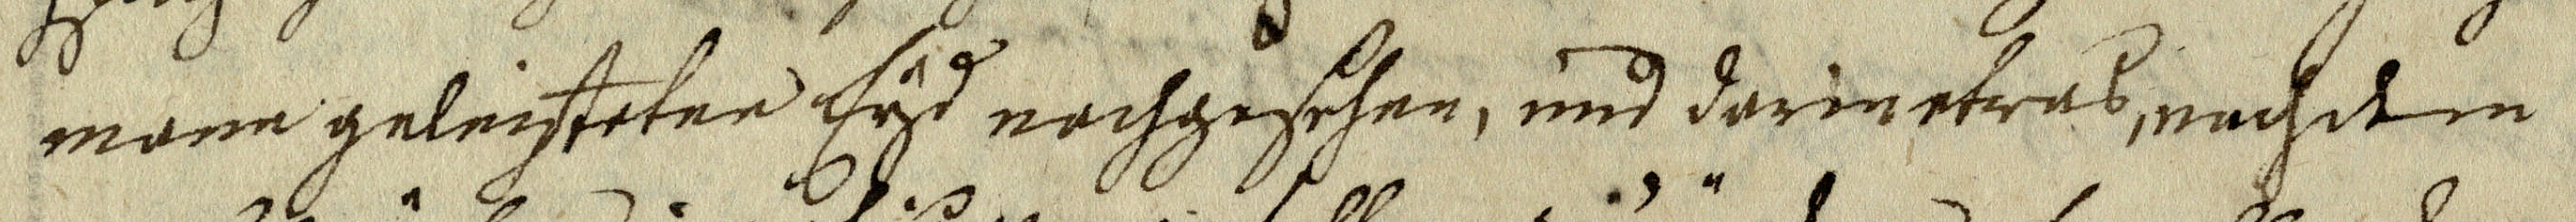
mann geleisteten Eÿd nachgesehen, und darin etwas, nachdem
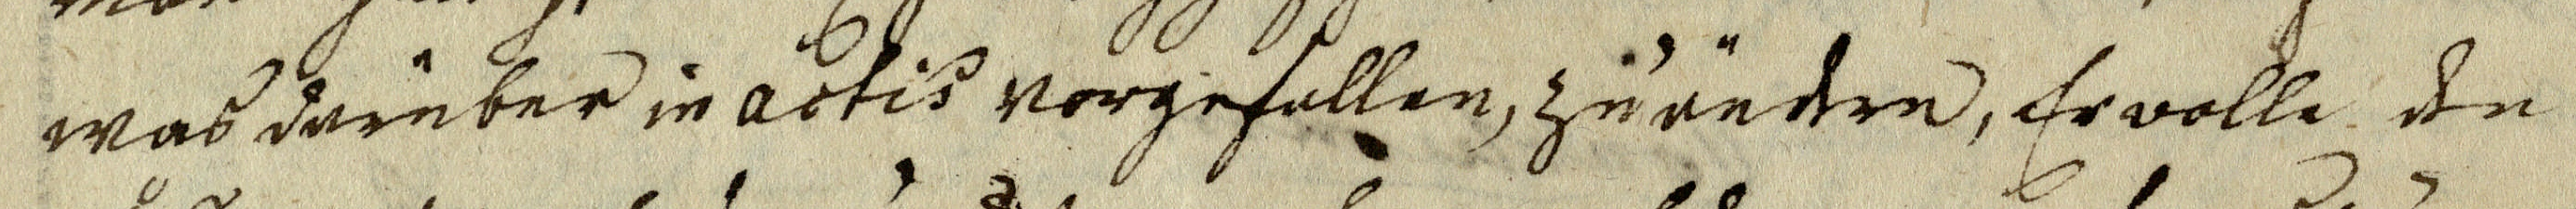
was darüber in actis vorgefallen, zu ändern, Er wolle den
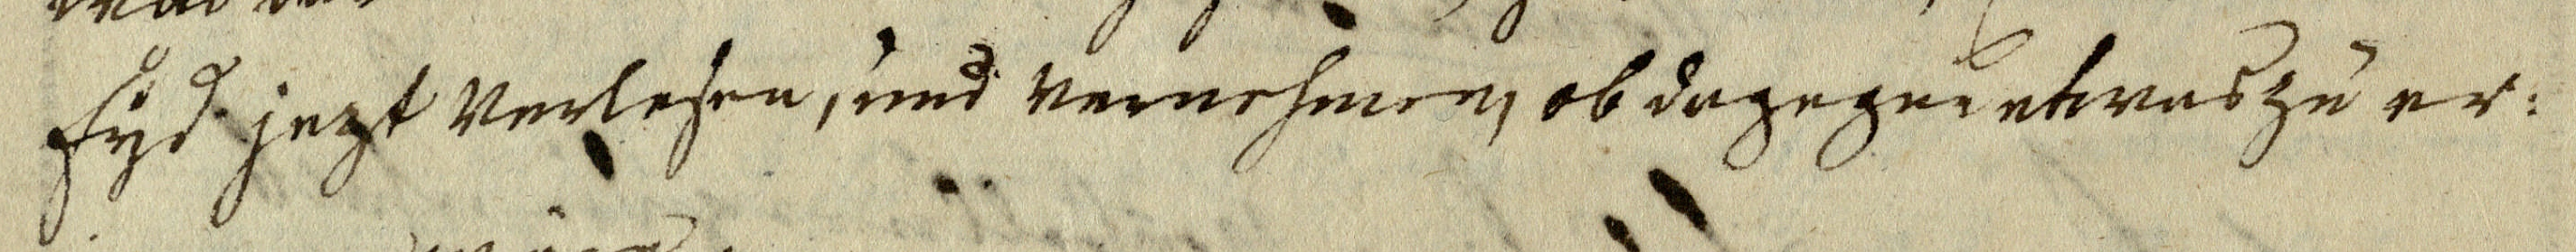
Eÿd jezt verlesen, und vernehmen, ob dagegen etwas zu er¬
